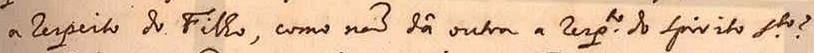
a Respeito do Filho, como naõ dâ outra a Resp.to do Spirito S.to?
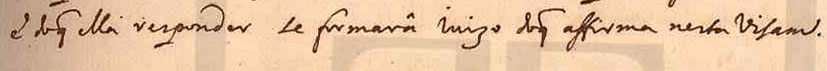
e do q̄ ella responder se formarâ iuizo do q̄ affirma nesta visam.
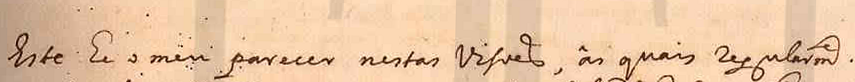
Este he o meu parecer nestas Visoẽs, as quais resularmte.
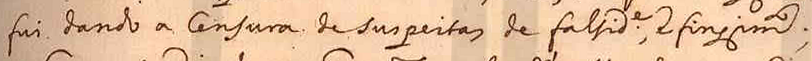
fui dando a Censura de suspeitas de falsid.e, e fingimto.
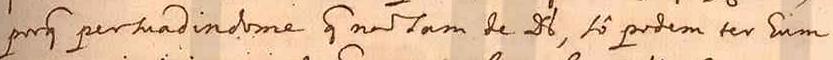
porq̄ persuadindome q̄ naõ sam de Ds̄, só podem ter hum
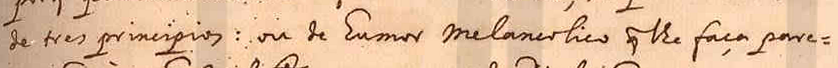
de tres principios: ou de humor melancolico q̄ lhe faça pare
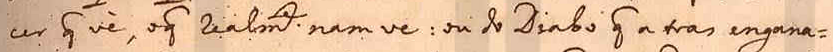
cer q̄ vè, o q̄ Realm.te nam ve, ou do Diabo q̄ a tras engana
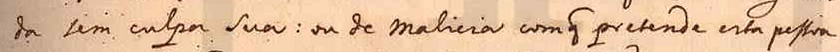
da sem culpa sua: ou de malicia com q̄ pretende esta pessoa
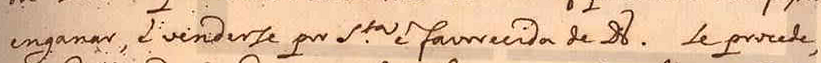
enganar, e venderse por S.ta e fauorecida de Ds̄. se procede,
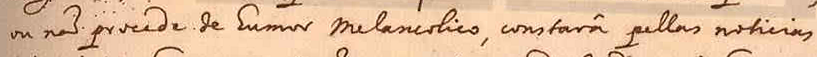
ou naõ procede de humor melancolico, constarâ pellas noticias
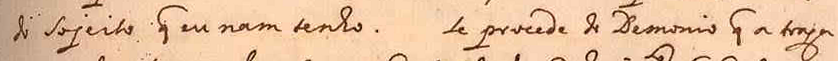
do sojeito q̄ eu nam tenho. se procede do Demonio q̄ a traga
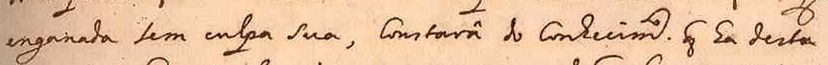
enganada sem culpa sua, Constarâ do Conhecim.to q̄ ha desta
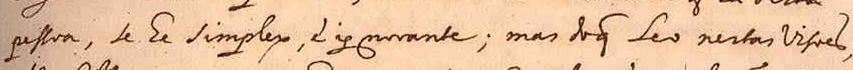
pessoa, se he simples, e ignorante; mas do q̄ Leo nesta visoẽs,
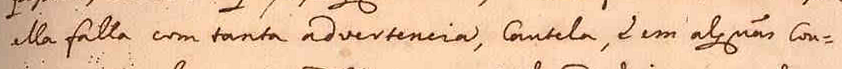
ella falla com tanta advertencia, Cautela, e em alguās cou
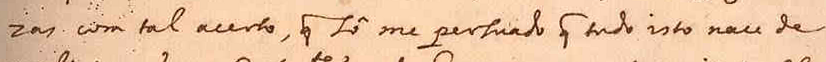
zas com tal acerto, q̄ sô me persuado q̄ tudo isto nace de
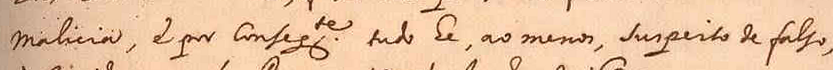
malicia, e por conseg.te tudo he, ao menos, suspeito de falso,
